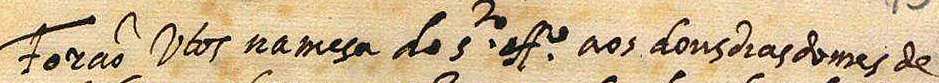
Foraõ vtos na mesa do sto. off.o aos dous dias do mes de
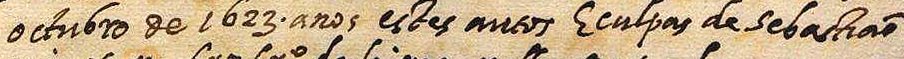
octubro de 1623. anos estes autos E culpas de sebastiaõ
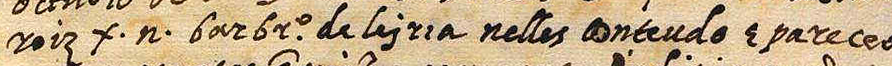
roiz x. n. barbr.o de lejria nelles conteudo E pareceo
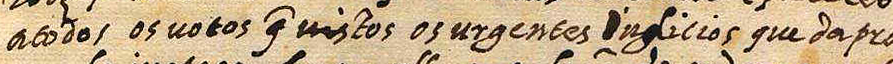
a todos os uotos q̄ uistos os urgentes indicios que da pro
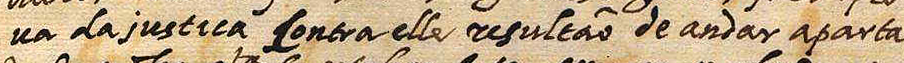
ua da justica Contra elle resultaõ de andar aparta
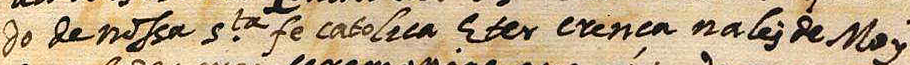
do de nossa s.ta fe catolica E ter crença na lej de Moy
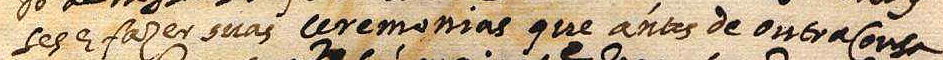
ses E fazer suas ceremonias que antes de outra Cousa
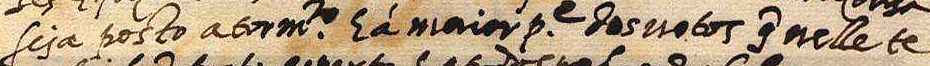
seja posto a torm.to E á maior p.e dos uotos q̄ nelle te
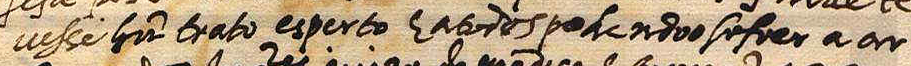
uesse hū trato esperto E a todos podendoo sofrer a ar
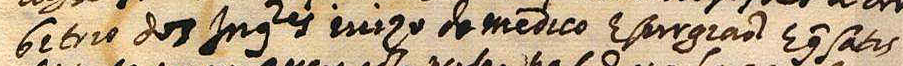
bitrio dos Jnqres iuizo de medico E surgiaõ E q̄ satis
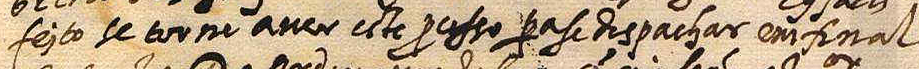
fejto se torne a uer este ꝓcesso ꝑa se despachar em finaL
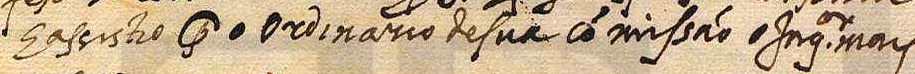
E assistio p̄ o ordinario de sua cōmissaõ o Jnq.or mais
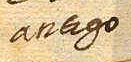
antigo
